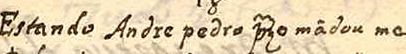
Estando Andre pedro p̄zo mādou me
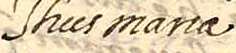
Jhus̄ maria
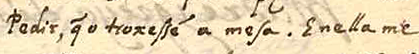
Pedir, q̄ o troxessē a mesa e nella me
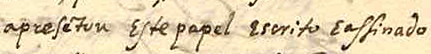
apresētou Este papel Escrito e assinado
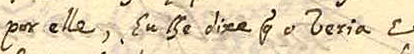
por elle, Eu lhe dixe q̄ o veria E
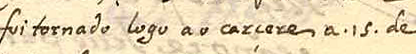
foi tornado logo ao carçere a .15. de
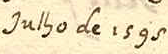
Julho de 1595
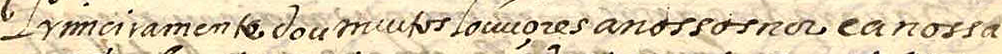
Primeiramente dou muitos louuores a nosso snōr e a nossa
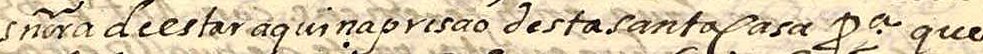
sn̄ora de estar aqui na prisaõ desta santa Casa ꝓ.a que
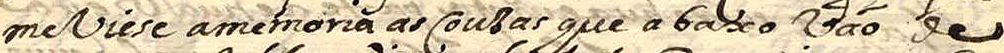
me viese a memoria as Couzas que abaxo vão de
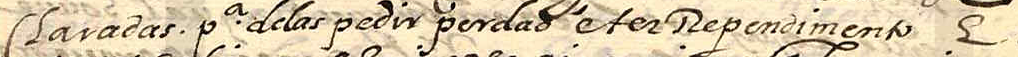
Claradas .pa. delas pedir perdaõ e ter Rependimento E
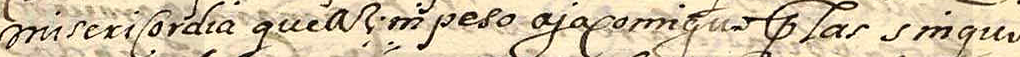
misericordia que a Vm peso aja Comiguo p̄las simquo
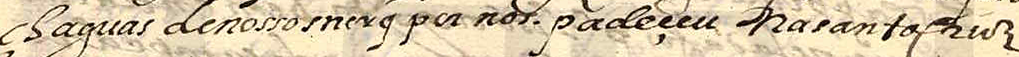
çhaguas de nosso snor̄ q̄ por nos. padeçeu na santa Cruz
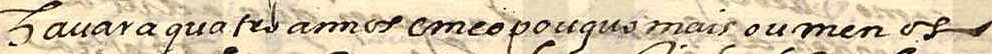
hauara quatro annos e meo pouquo mais ou menos
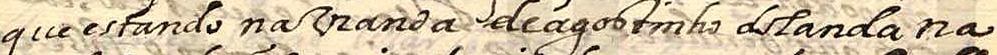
que estando na vranda de agostinho dolanda na
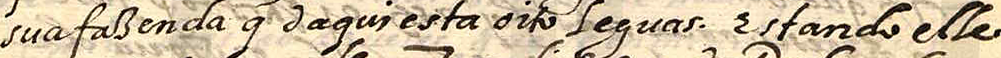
sua fazenda q̄ daqui esta oito leguas. Estando elle
